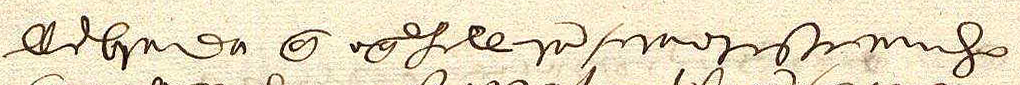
llēbrada q̄ o q̄ se llerā fora o testemunho
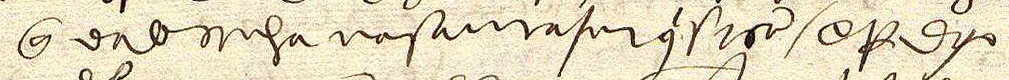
q̄ dado tinha na santa Jmqisiçā / e pedyo
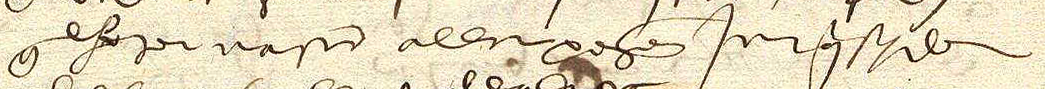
q̄ lho tornasē a ller e o s̄or Jmqisydor
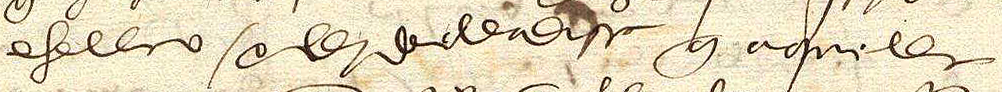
lhe lle / e lljdo ella dise q̄ aquelle
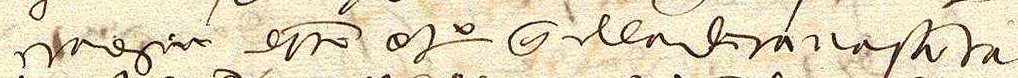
era o seu dito e to q̄ ella dera na sāta
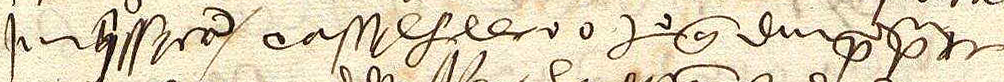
Jmq̄ssjçā/ e assy lhe lleo o to q̄ deo p̄o p̄te
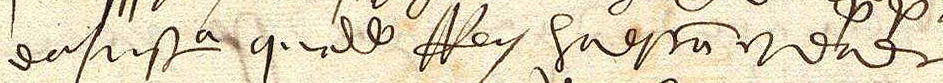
da Justa quādo ffoy ha djta cidade
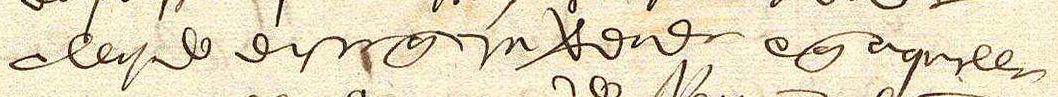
e llydo disse q̄ era ꝟdade e q̄ aquelle
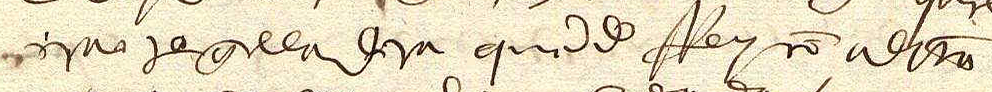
era o to q̄ ella dera quādo ffoy c̄o a djta
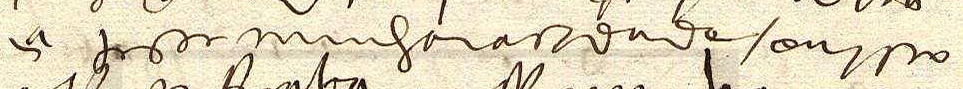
ma testemunhar a cidade / e njsso
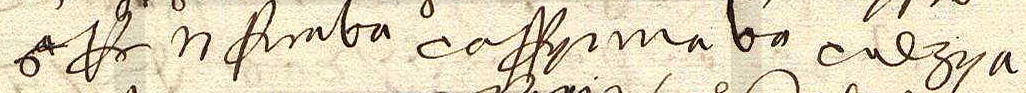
se Retificava e affyrmava e o dezya
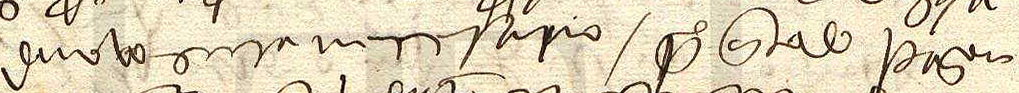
de novo se era necesario / p̄oq̄ todo pasou
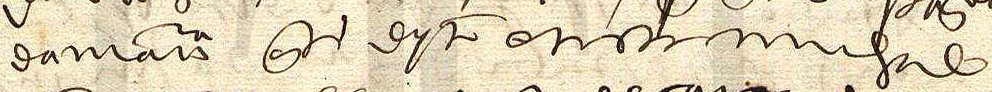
da manra q̄ tē dyto e testemunhado
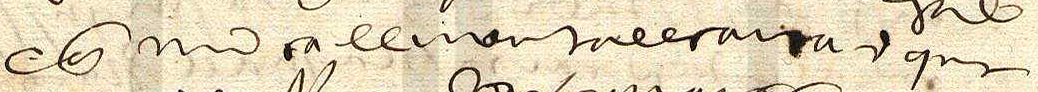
e q̄ nūca lleuou tall carta ē que
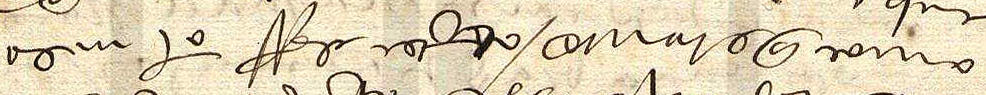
o seu to ffose escrto / e majs q̄ como
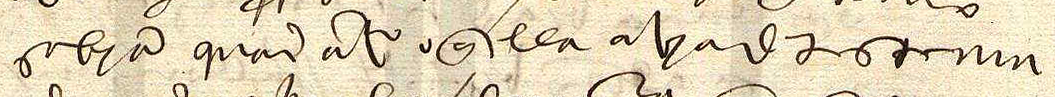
sabyā qua ē avro o q̄ ella avja de testemu
